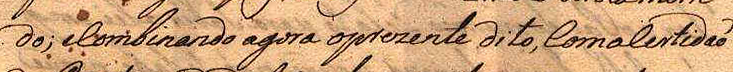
do; e Combinando agora o prezente dito, Com a Certidaõ
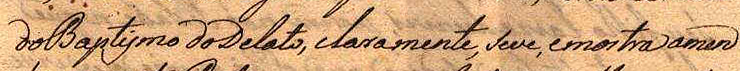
do Baptismo do Delato, claramente, se ve, e mostra a men
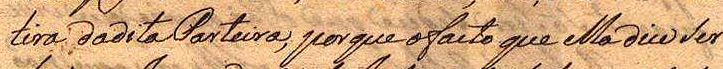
tira da dita Parteira, porque o facto que ella dice ser
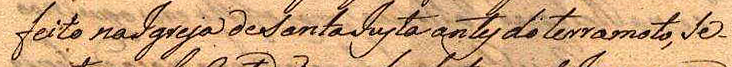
feito na Igreja de Santa Iusta antes do terramoto, se
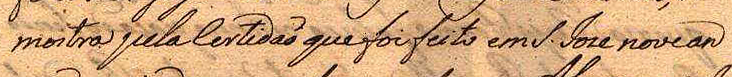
mostra pela Certidaõ que foi feito em S. Ioze nove an
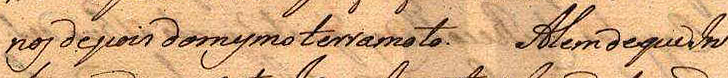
nos depois do mesmo terramoto. Alem de que In
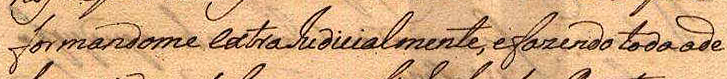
formandome extraIudicialmente, e fazendo toda a de
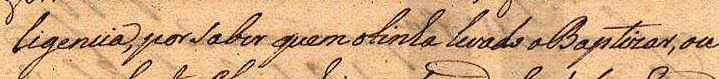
ligencia, por saber quem o tinha levado o Baptizar, ou
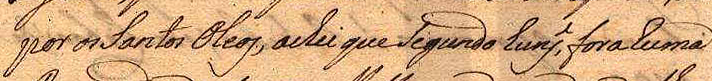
por os Santos Oleos, achei que segundo huns, fora huma
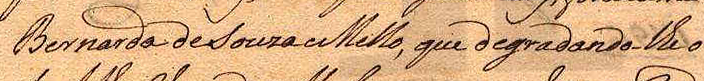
Bernarda de Souza e Mello, que degradando-lhe o
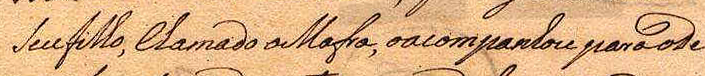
seu filho, chamado o Mafra, o acompanhou para o De
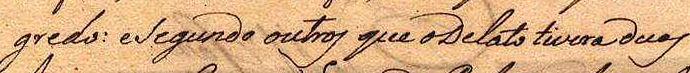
gredo: e segundo outros que o Delato tivera duas
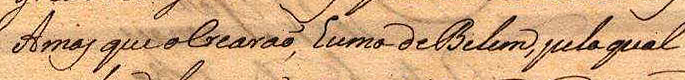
Amas que o Crearaõ, huma de Belem, pela qual
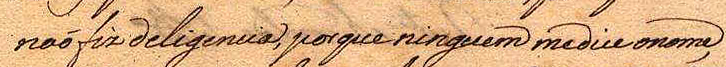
naõ fiz deligencia, porque ninguem me dice o nome,
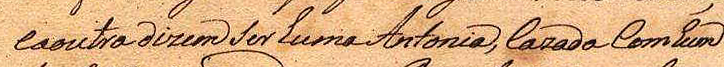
e a outra dizem ser huma Antonia, Cazada Com hum
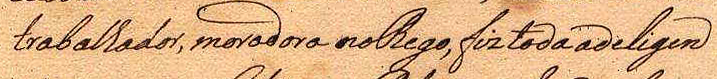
trabalhador, moradora no Rego, fiz toda a deligen
